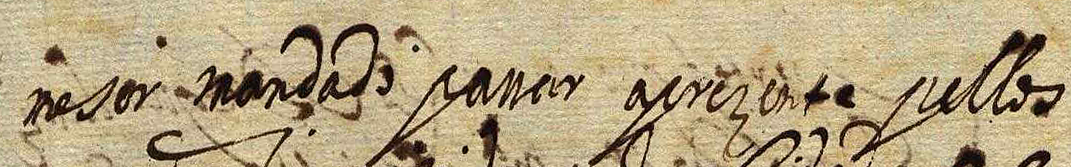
me ser mandado passar a prezente pellos
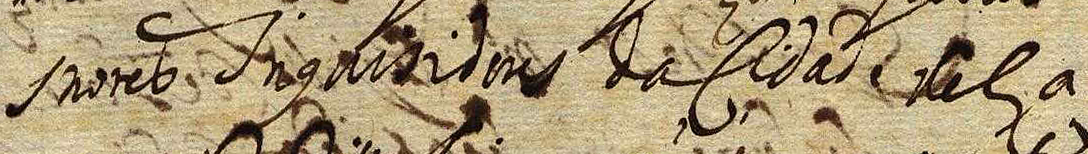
snores̄ Inquisidores da Cidade de La
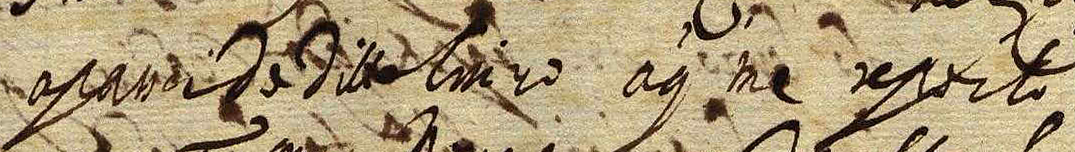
a passei do ditto liuro a q̄ me reporto
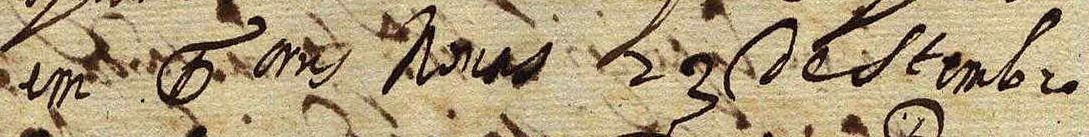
em Torres Nouas 23 de stembro
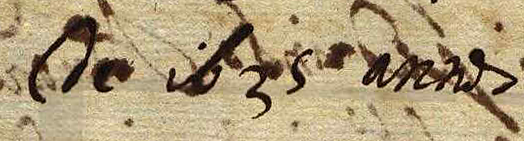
de i635 annos
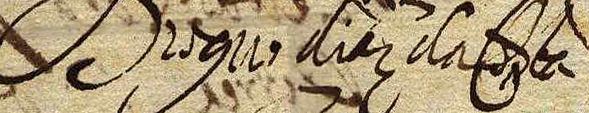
Dioguo diaz da Costa
